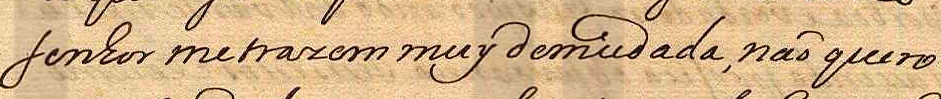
senhor me trazem muy demudada, naõ quero
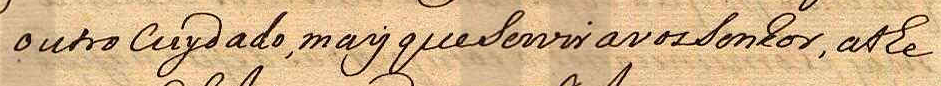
outro cuydado, mais que servir a vos Senhor athe
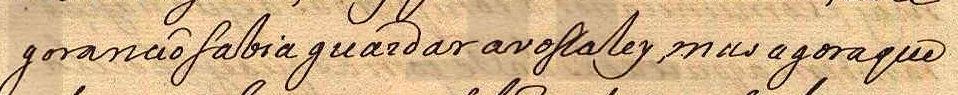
gora naõ sabia guardar a vossa ley mas agora que
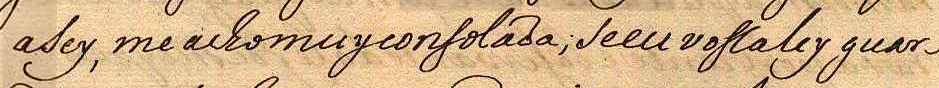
a Sey, me acho muy consolada; se eu vossa ley guar
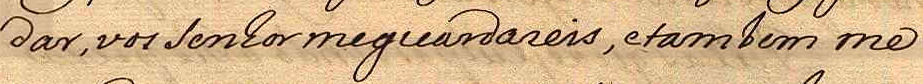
dar, vos senhor me guardareis, e tambem me
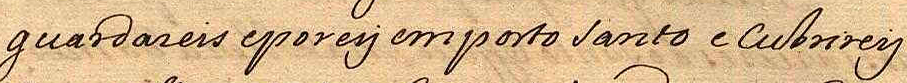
guardareis e poreis em porto santo e cubrireis
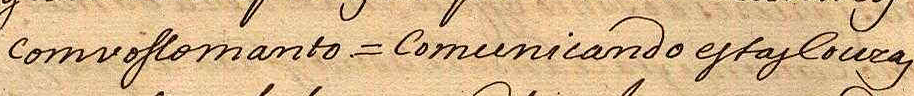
com vosso manto = comunicando estas couzas
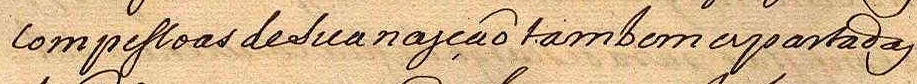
com pessoas de sua nasçaõ tambem apartadas
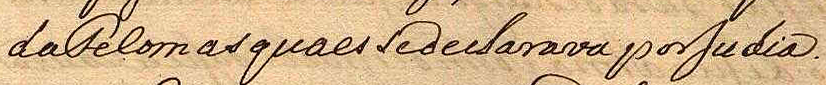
da Fe com as quaes se declarava por Judia.
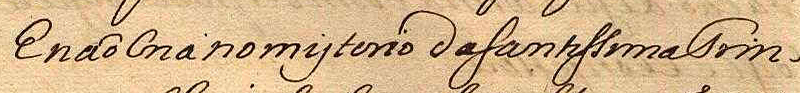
E naõ Cria no misterio da santissima Trin
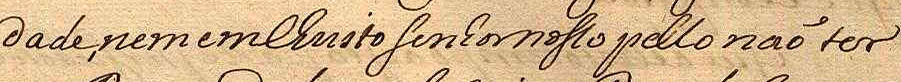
dade, nem em Christo senhor nosso pello naõ ter
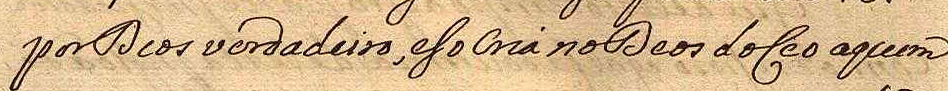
por Deos verdadeiro, e so cria no Deos do Ceo a quem
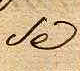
se
